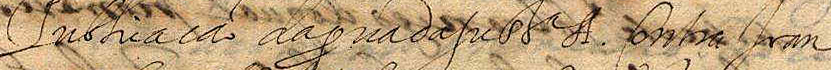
Publicacaõ da ꝓua da Justa A. Contra Joan
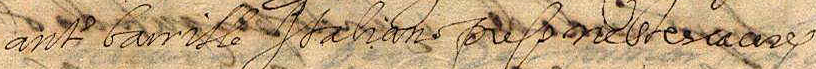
anto barrille Jtaliano preso nestes caceres
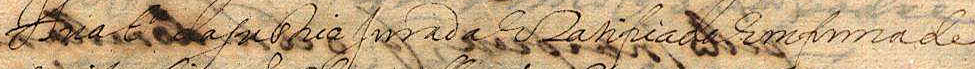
Hua ta da Justica Jurada E Ratificada Em forma de
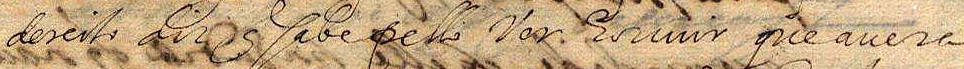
dereito diz q̄ sabe pello Ver E ouuir que auera
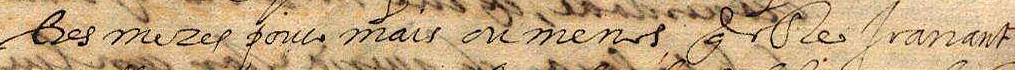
tres mezes pouco mais ou menos, q̄ o Reo Joan anto
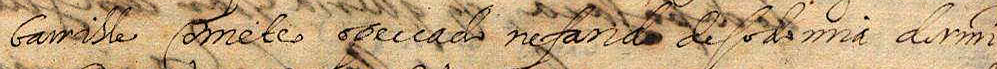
barrille Cometeo o peccado nefando de sodomia dormī
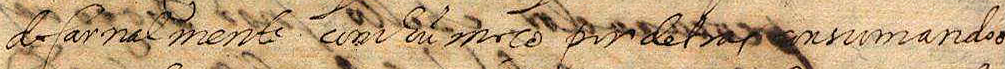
do Carnalmente com hū moço por detras consumandoo
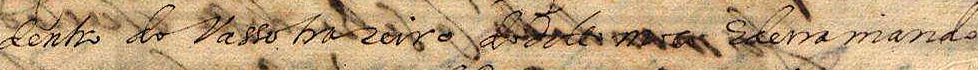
dentro do Vasso trazeiro do dito moco E derramando
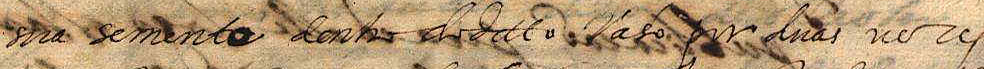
sua semente dentro do ditto Vaso por duas uezes
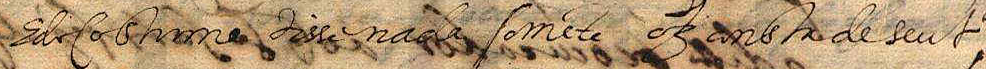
E do Costume disse nada somēte o q̄ consta de seu to,
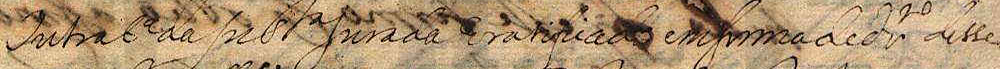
Outra ta da Justa Jurada E ratificad_ em forma de drto disse
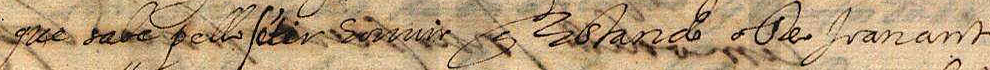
que sabe pello sētir E ouuir q̄ Estando o Reo Joan anto
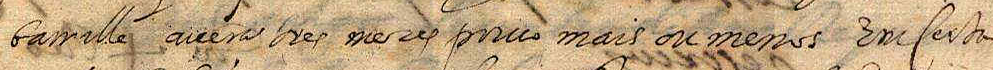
barrille auera tres mezes pouco mais ou menos Em Certa
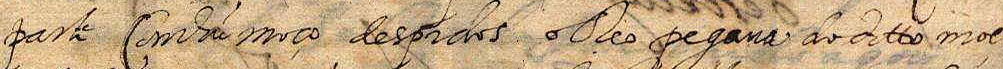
parte Com hū moço despidos o Reo pegaua do ditto moço
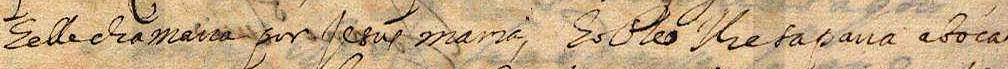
E elle chamaua por Jesus maria, E o Reo lhe tapaua a boca
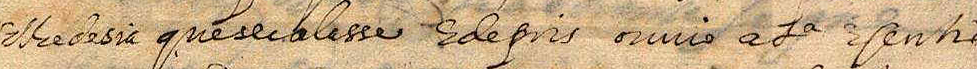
E lhe desia que se calasse E depois ouuio a ta E sentio
